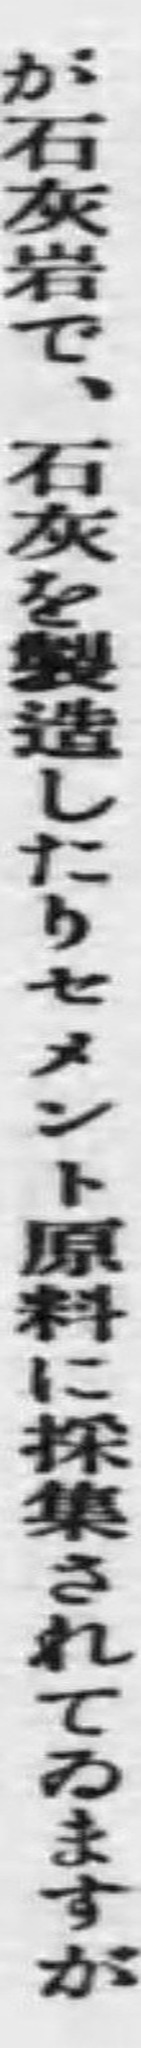が石灰岩で、石灰を製造したりセメント原料に採集されてゐますが
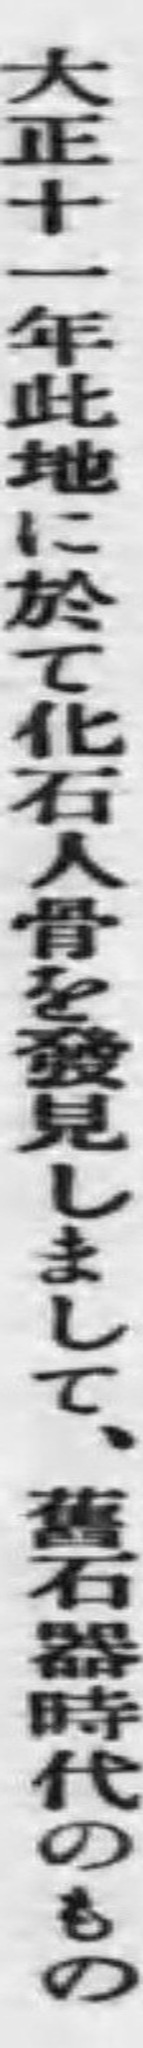大正十一年此地に於て化石人骨を発見しまして、旧石器時代のもの
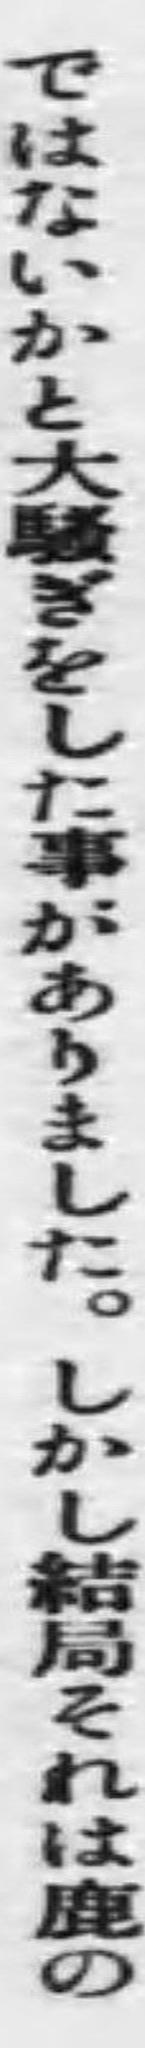ではないかと大騒ぎをした事がありました。しかし結局それは鹿の
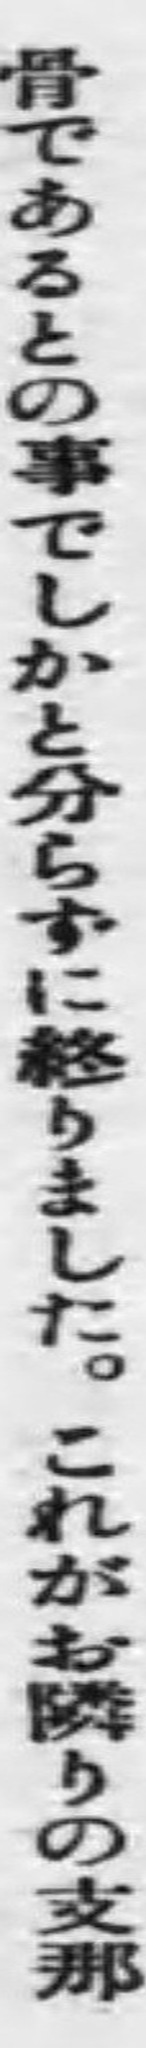骨であるとの事でしかと分らずに終りました。これがお隣りの支那
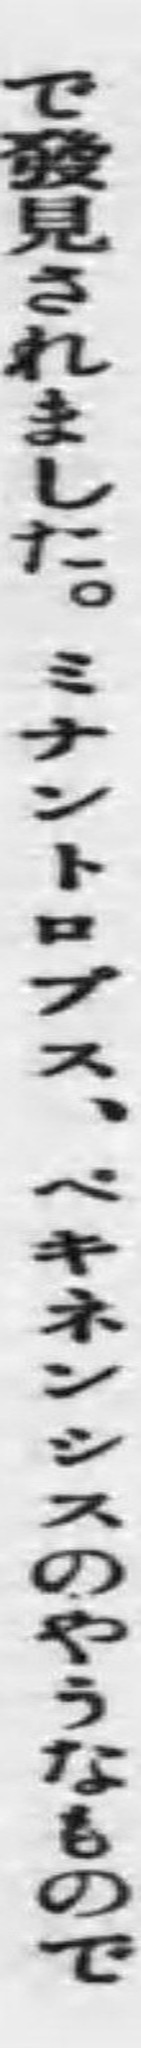で発見されました。ミナントロプス、ペキネンシスのやうなもので
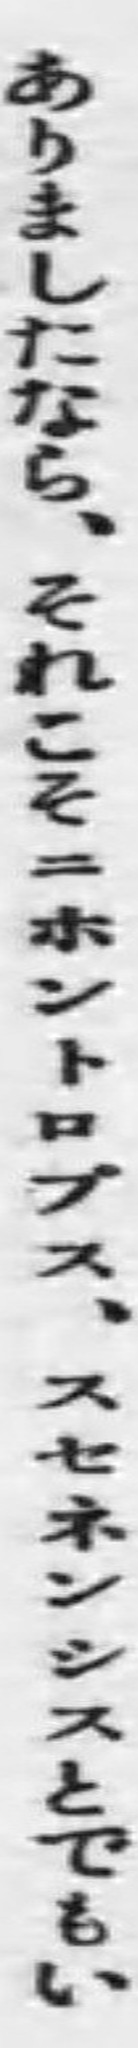ありましたなら、それこそニホントロプス、スセネンシスとでもい
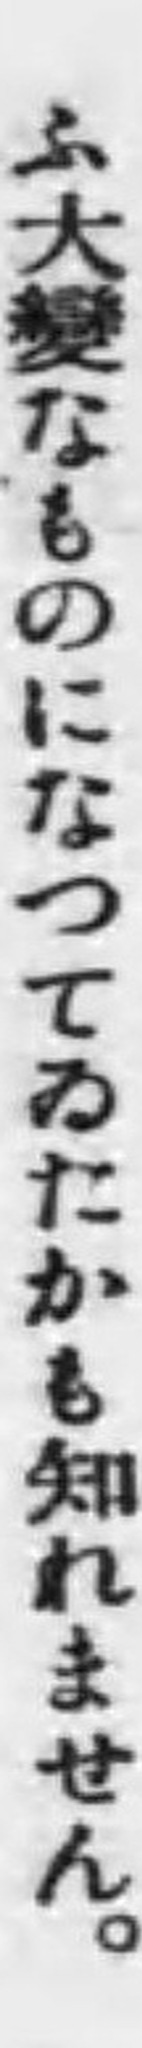ふ大変なものになつてゐたかも知れません。
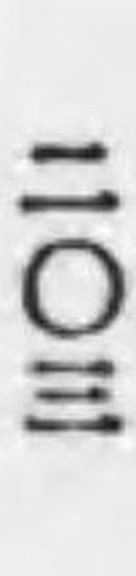二〇三

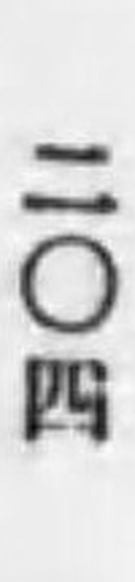二〇四
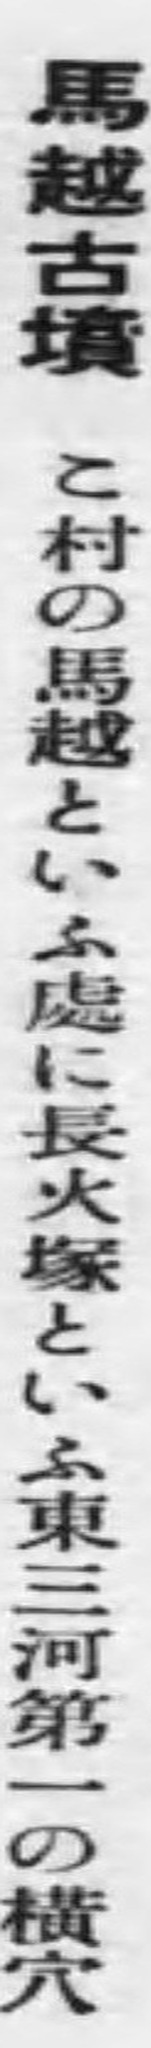馬越古墳こ村の馬越といふ処に長火塚といふ東三河第一の横穴
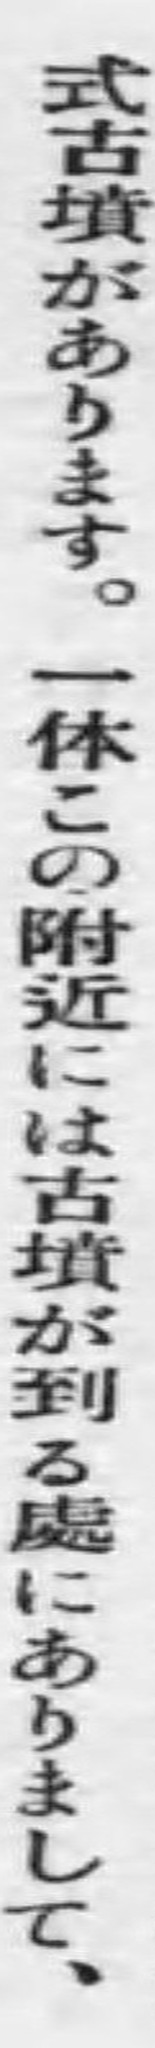式古墳があります。一体この附近には古墳が到る処にありまして、
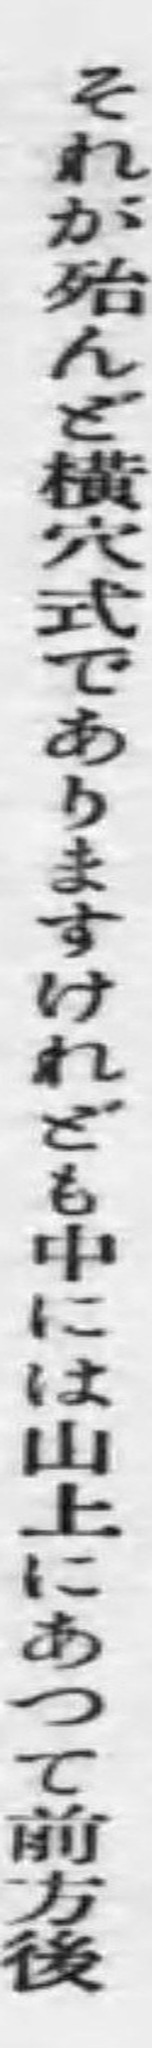それが殆んど横穴式でありますけれども中には山上にあつて前方後
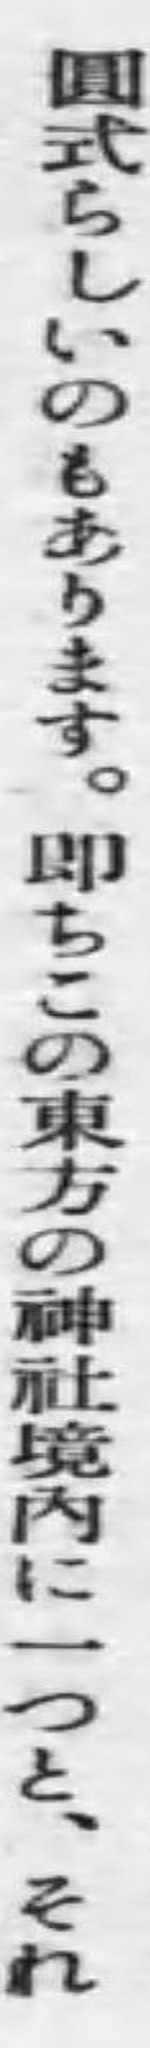円式らしいのもあります。即ちこの東方の神社境内に一つと、それ
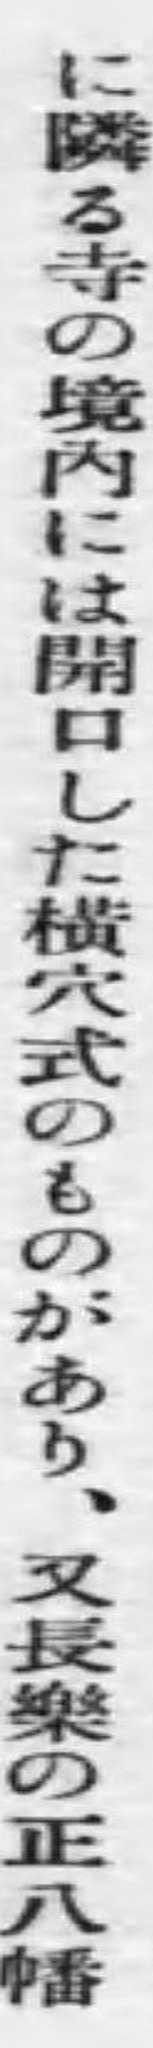に隣る寺の境内には開口した横穴式のものがあり、又長楽の正八幡
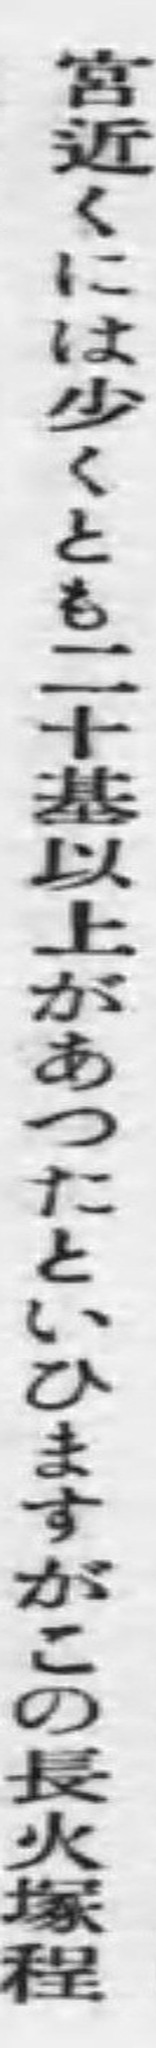宮近くには少くとも二十基以上があつたといひますがこの長火塚程
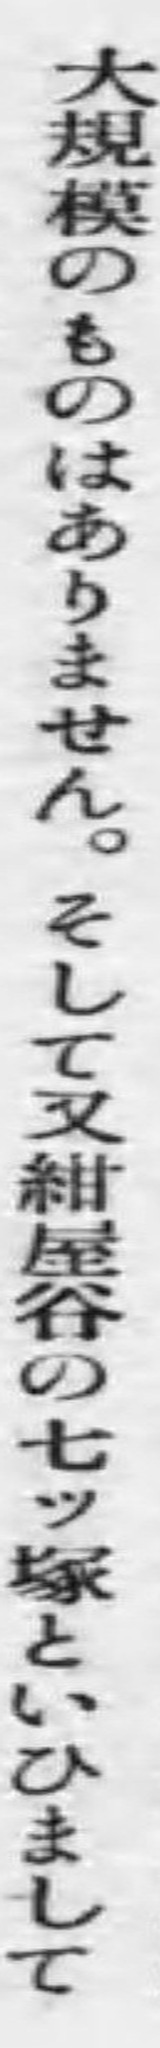大規模のものはありません。そして又紺屋谷の七ツ塚といひまして
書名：東三河道中記 : 豊橋市及其附近案内
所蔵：国立国会図書館 National Diet Library, JAPAN
